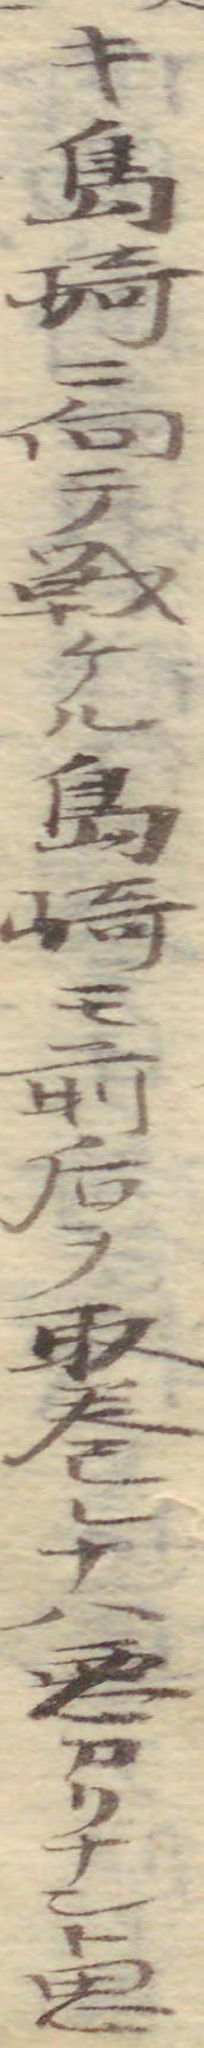キ島崎ニ向テ戦ナル島崎モ前后ヲ取巻シナハ悪カリナント思
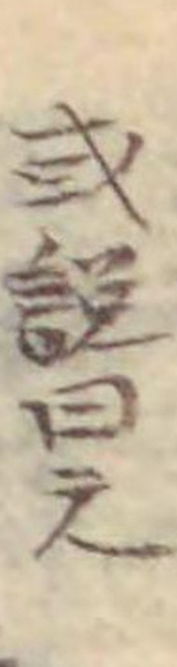或説曰元
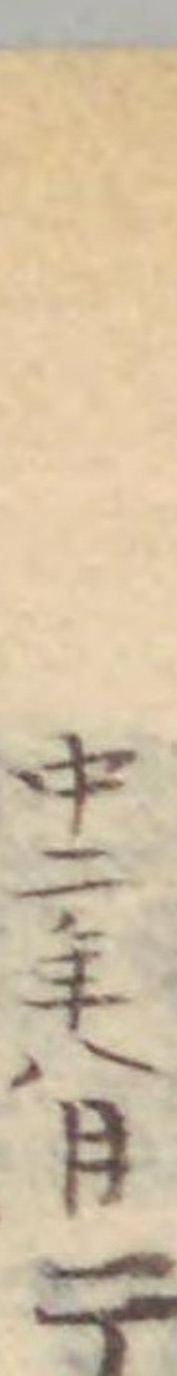中二年八月
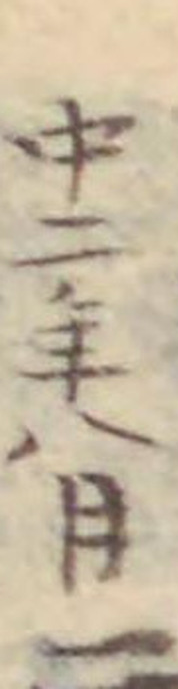中二年八月
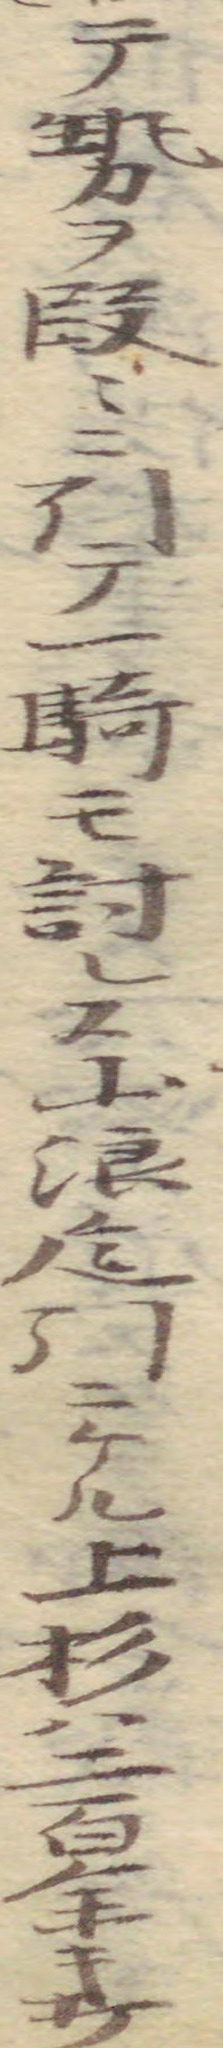テ勢ヲ段々ニ引テ一騎モ討レス山浪迄引ニケル上杉ハ二百余キ打
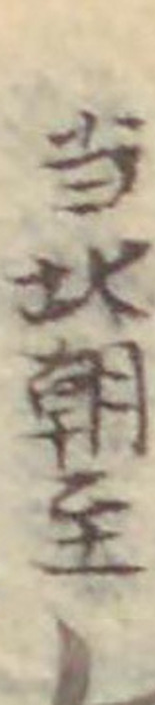当北朝至
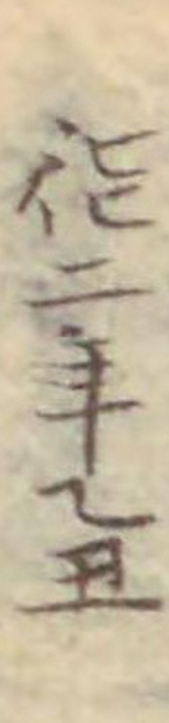徳二年乙丑
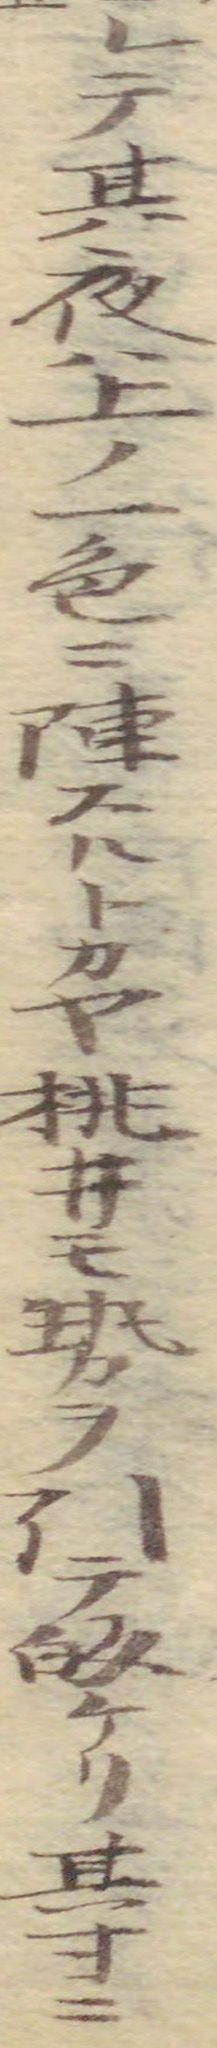レテ其夜ハ上ノ一色ニ陣スルトカヤ桃井モ勢ヲ引テ皈ケリ其寸ニ
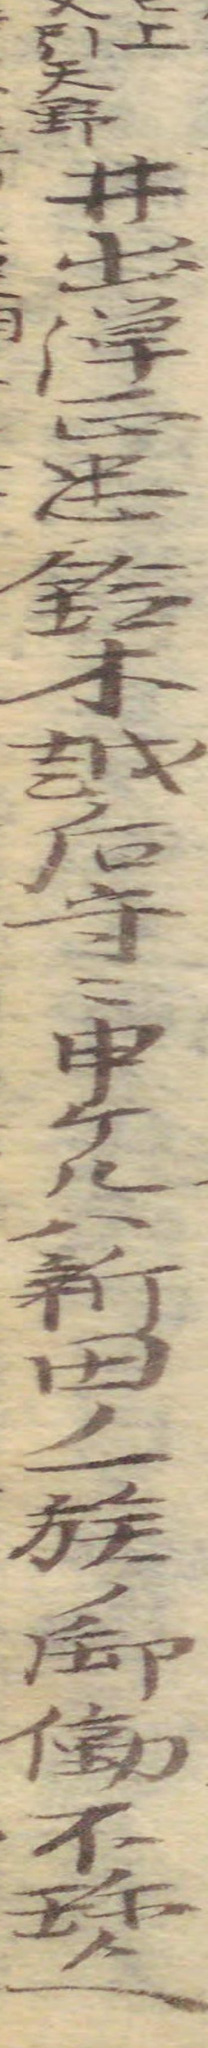井出弾正正忠鈴木越后守ニ申ケルハ新田ノ一族ノ御働不珎候ヘ

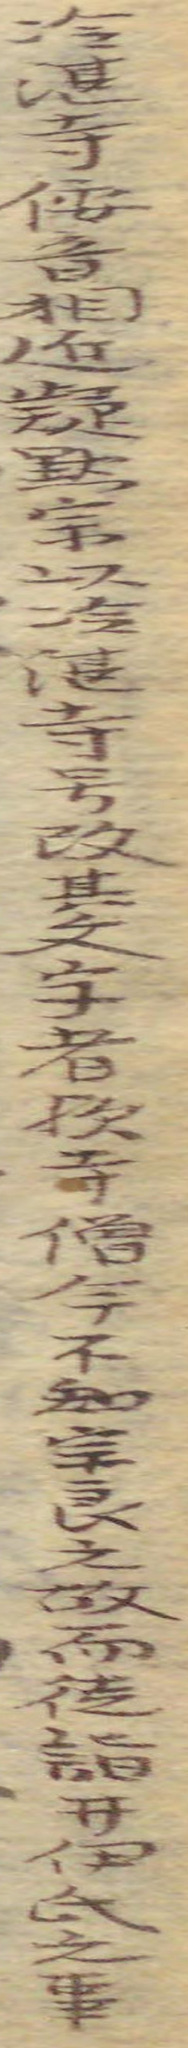冷湛寺佞音相近疑黙宗以冷湛寺号改其文字者歟寺僧今不知宗良野之故而徒詣井伊氏之事
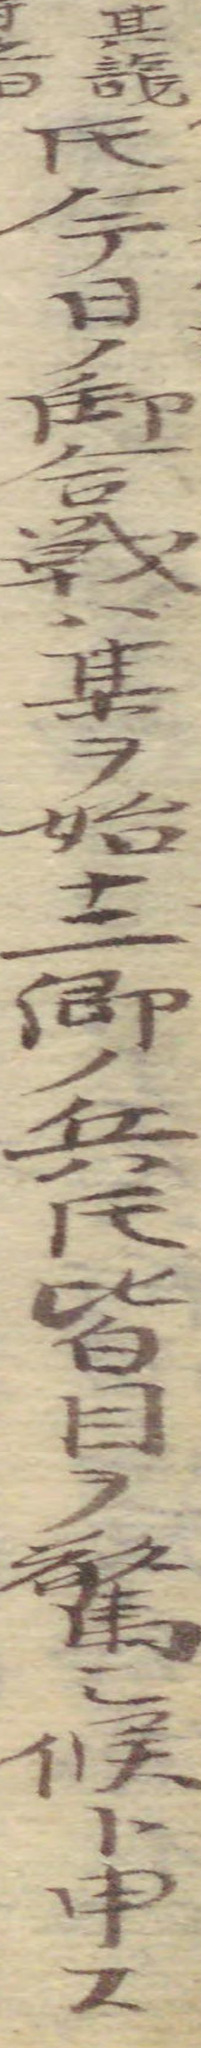トモ今日ノ御合戦ハ某ヲ始十二郷ノ兵トモ皆目ヲ驚シ候ト申ス
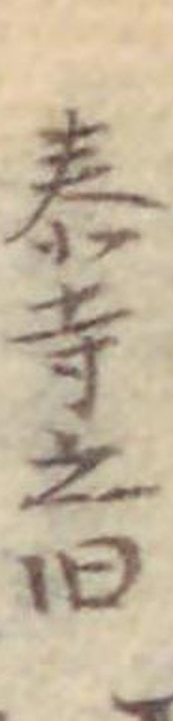泰寺之旧
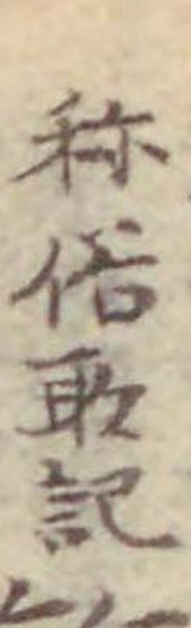称俗取記
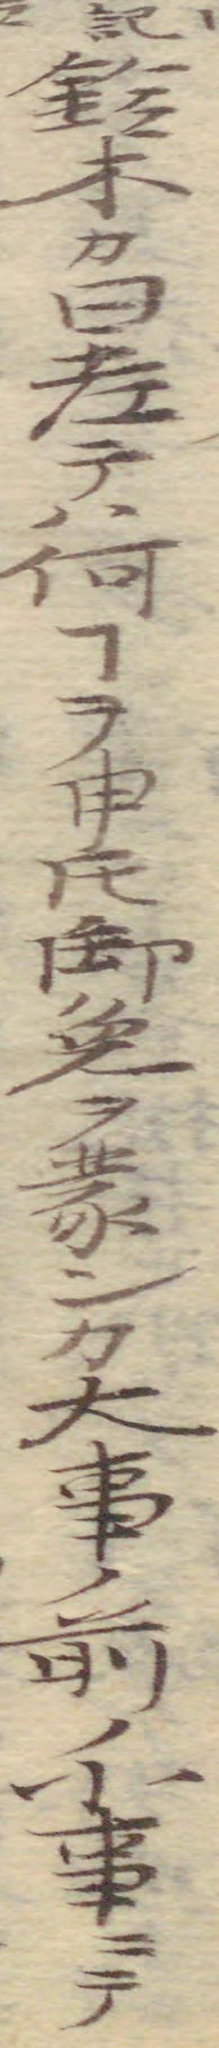鈴木カ曰老テハ何コトヲ申トモ御免ヲ蒙ンカ大事ノ前ノ小事ニテ
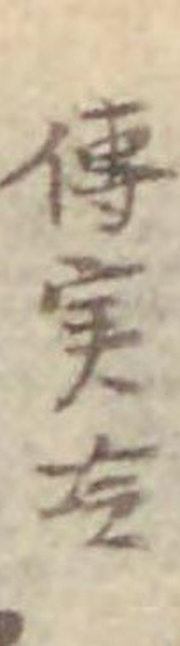伝実冷
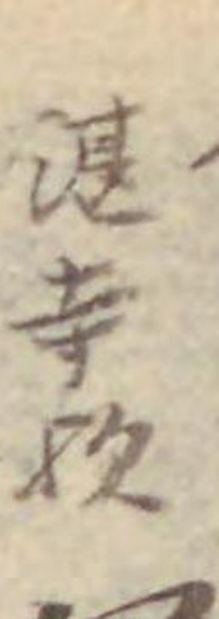湛寺歟
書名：鶯宿雑記. 巻199-200
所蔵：国立国会図書館 National Diet Library, JAPAN
